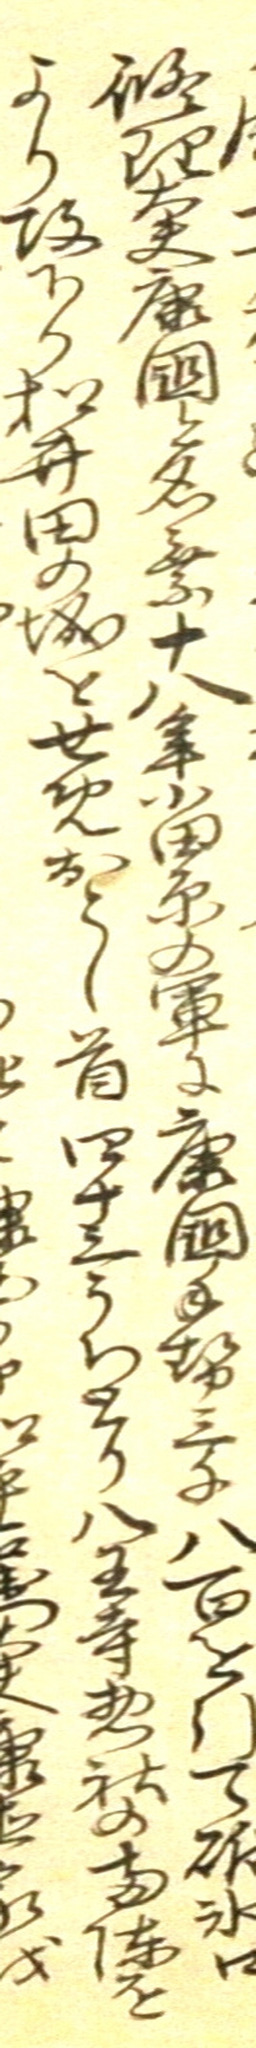より攻下り松井田の城をせめおとし首四十三うちとり八王寺惣社の両陣を
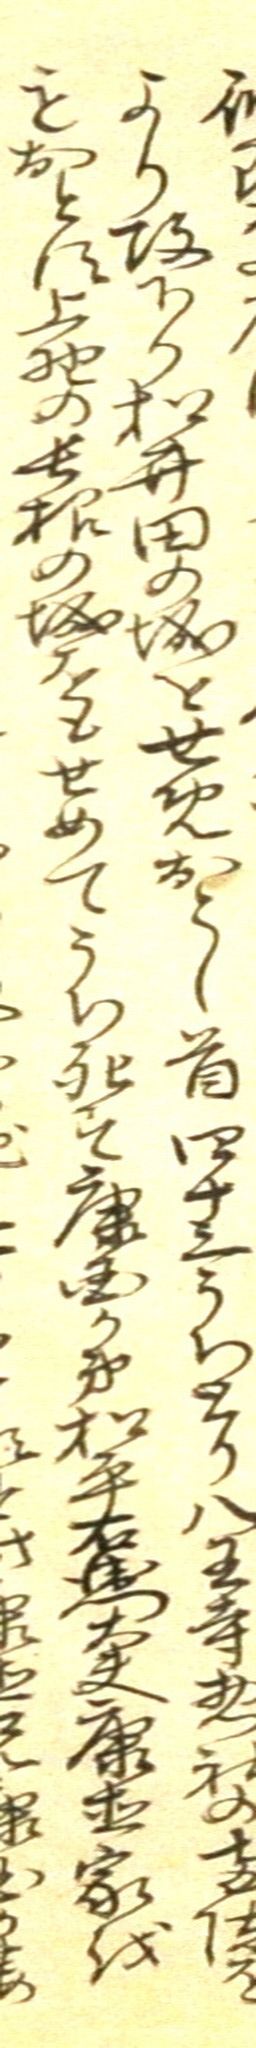もおとす上野の長根の城をもせめてうち死す康国か弟松平右衛門大夫康直家を
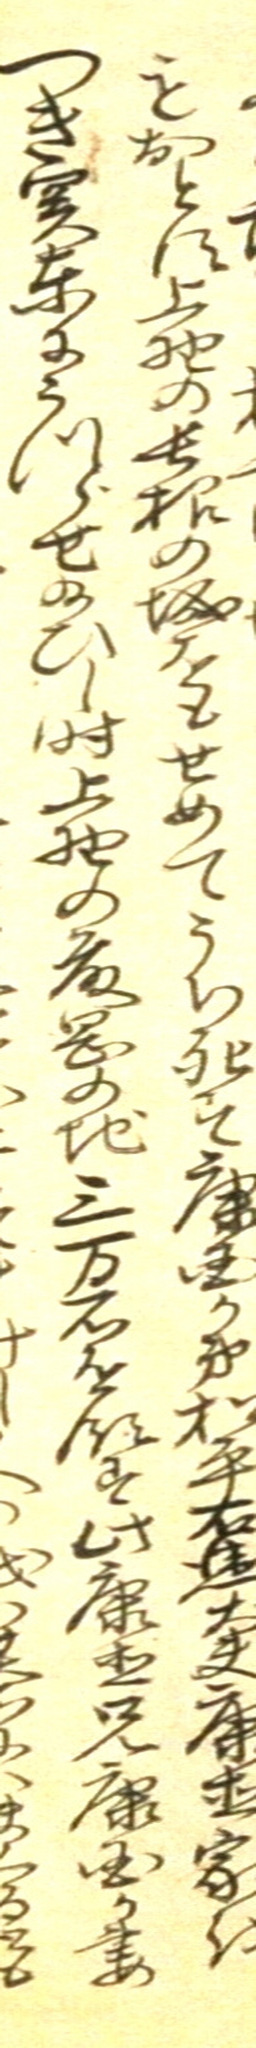つき関東にうつらせ給ひし時上野の藤岡の地三万石を領す康直兄康国か妻
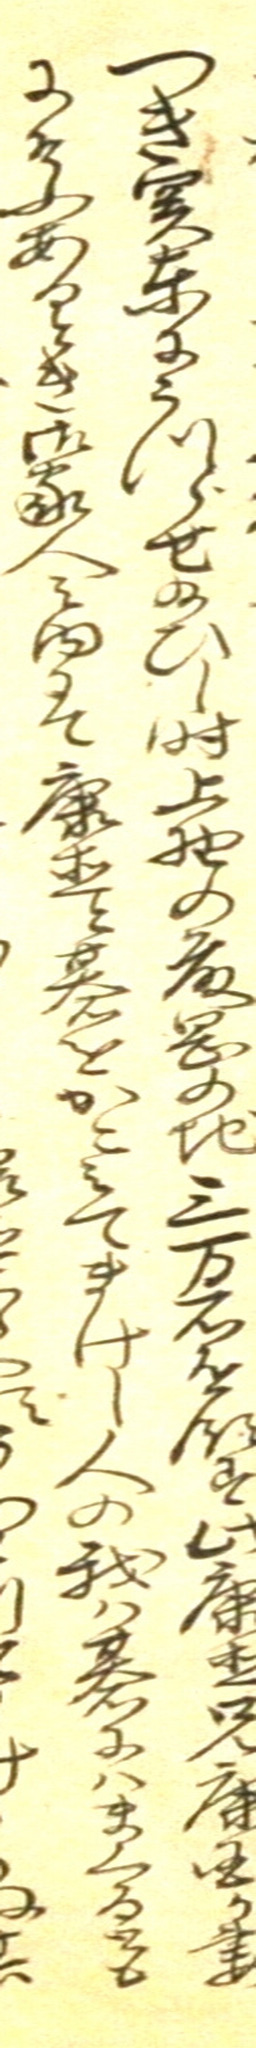にそふあるとき御家人之内にて康直と碁をかこみてまけし人の我は碁にはまくるとも
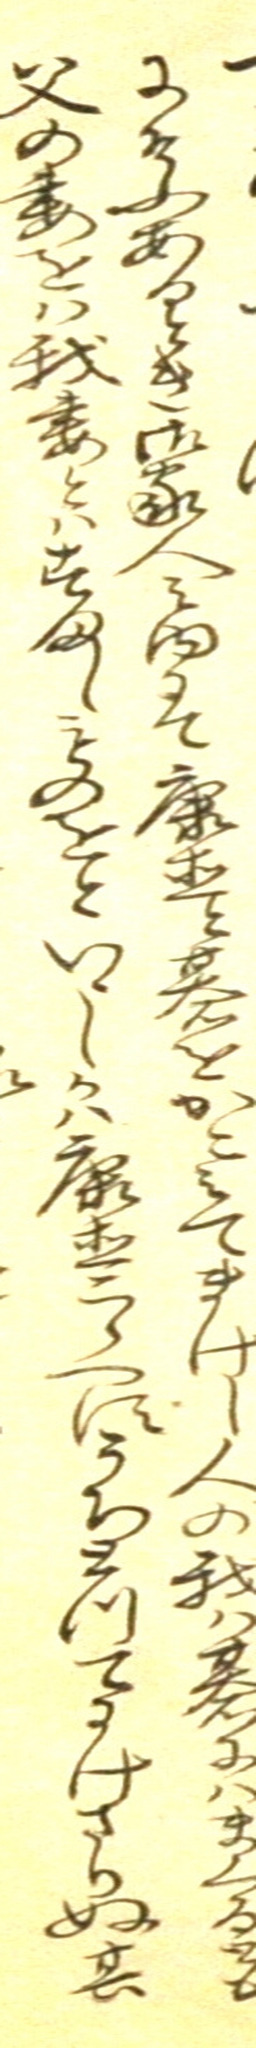父の妻をは我妻とはすましものをといゝしかは康直こらへすうちとつてにけさりぬ其

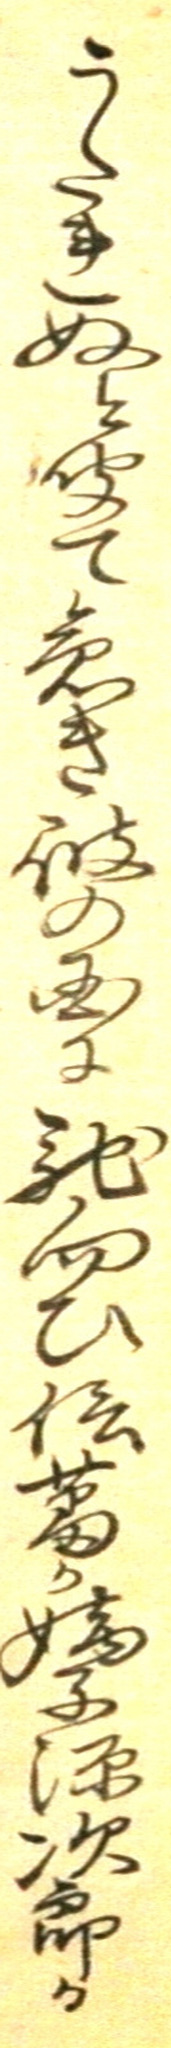うたれぬと聞て急き彼の国に馳向ひ信蕃か嫡子源次郎か
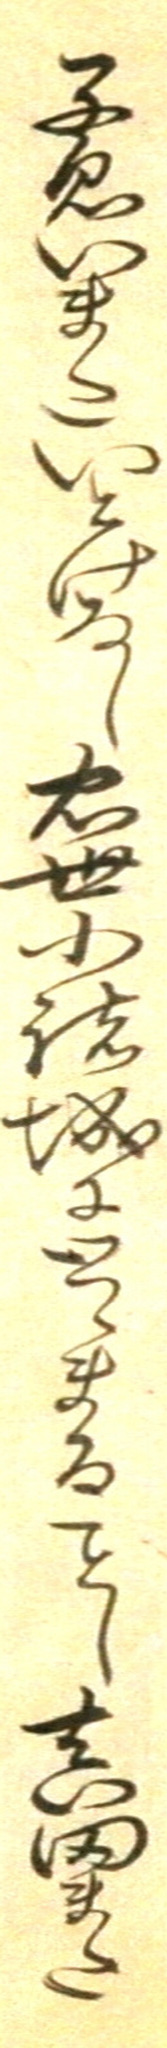子息いまたいとけなし忠世小諸城にとゝまることし真田また
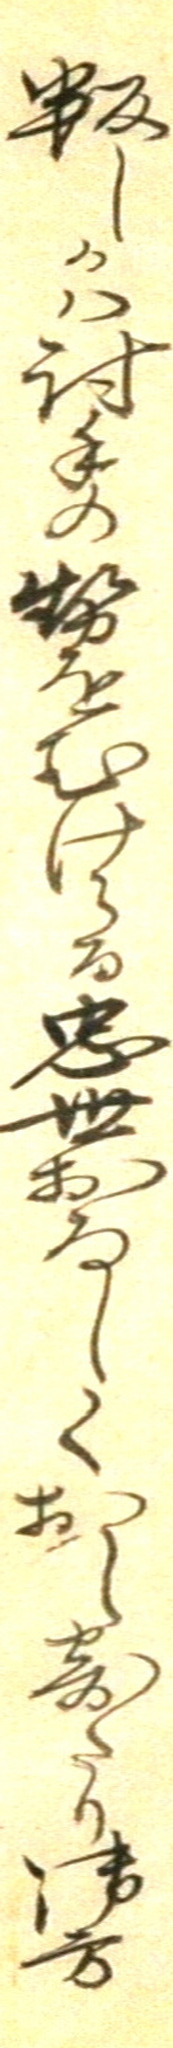叛しかは討手の勢をむけらる忠世おなしくおし寄たり御方
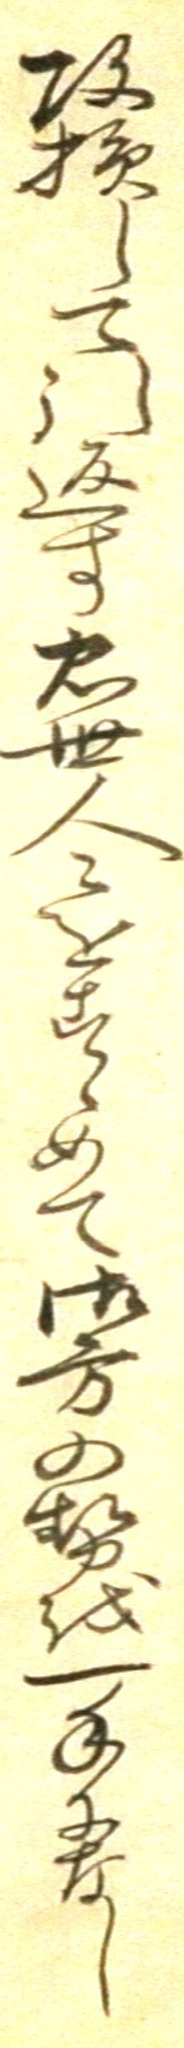攻損して引返す忠世人々をすゝめて御方の勢を一手になし
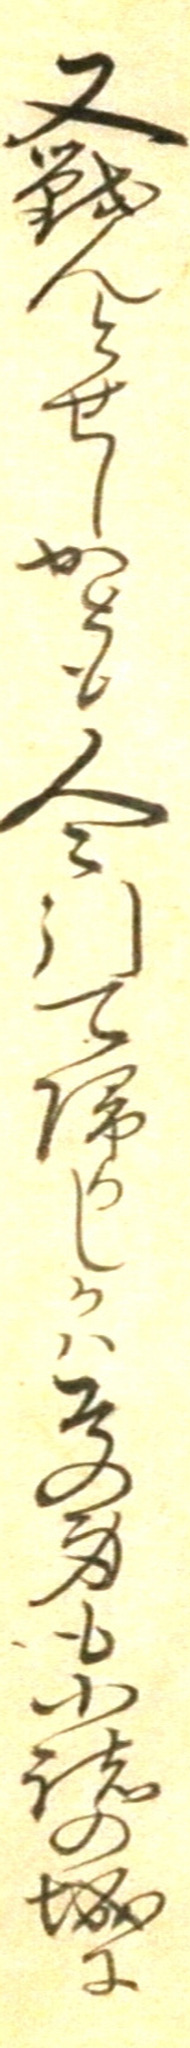又戦んとせしかとも人々引て帰りしかはその身も小諸の城に
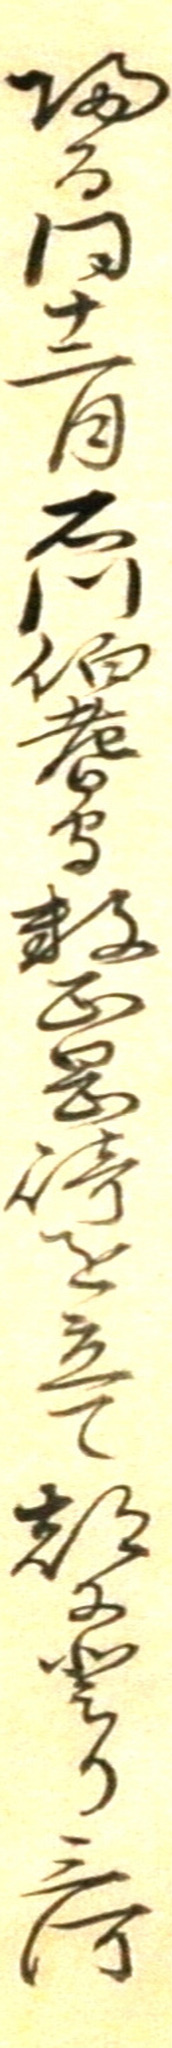帰る同十二月石川伯耆守数正岡崎を立て都に登り三河
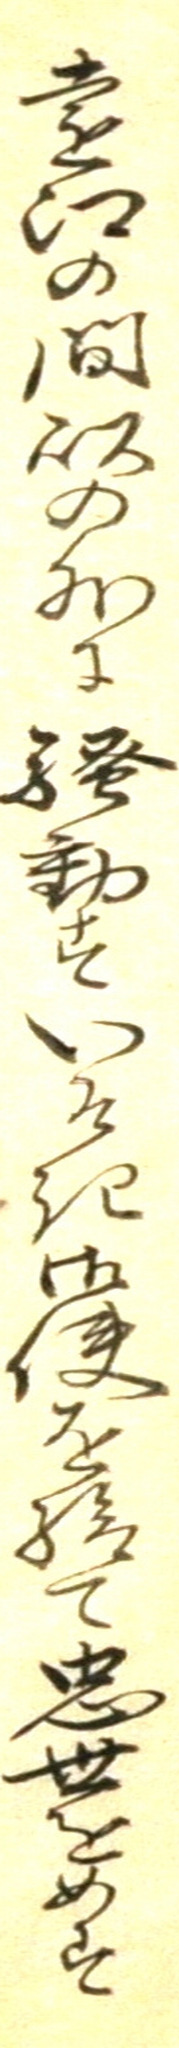遠江の間以の外に騒動すいそき御使を給て忠世をめす
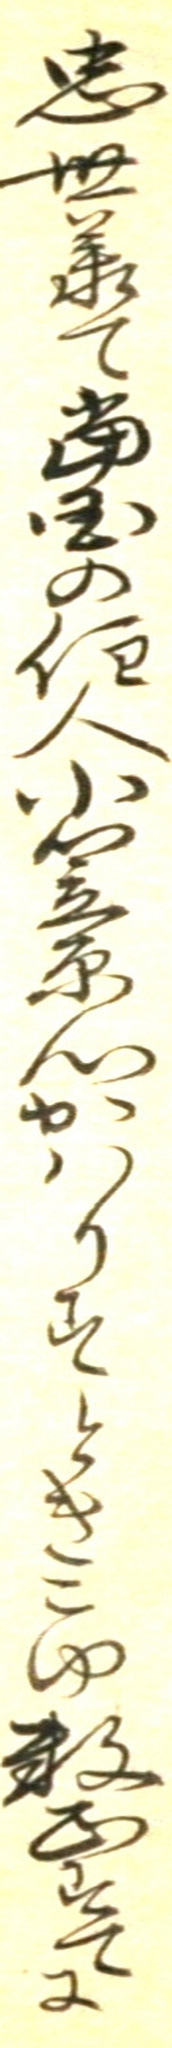忠世承て当国の住人小笠原心かはりすときこゆ数正すてに
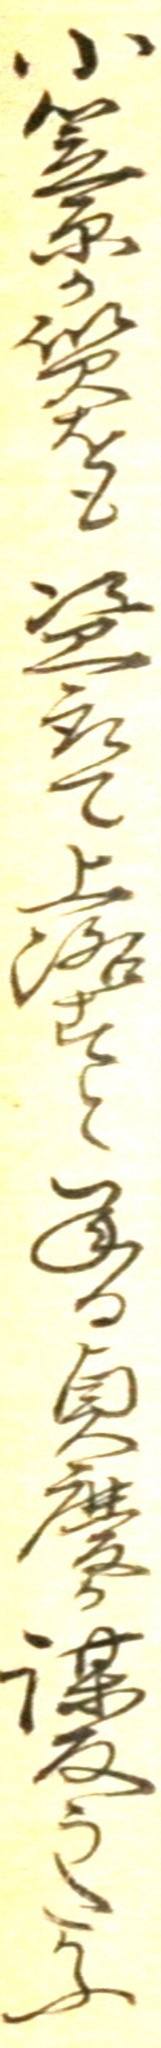小笠原か質をも盗取て上洛すと承る貞慶か謀反うたかふ
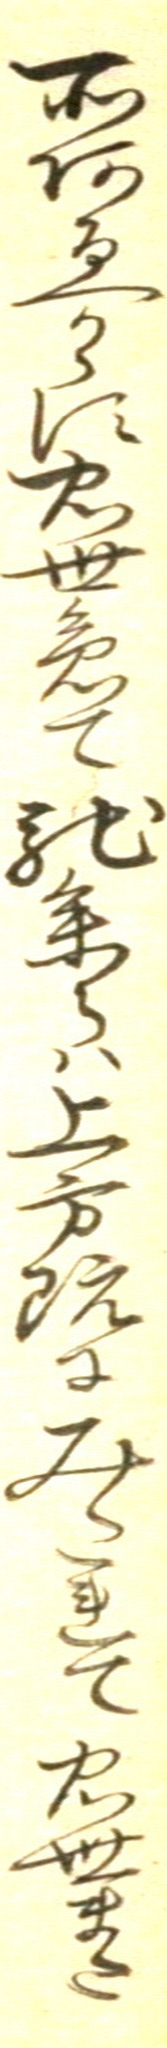所あるへからす忠世急て馳参らは上方既にみたれて忠世また
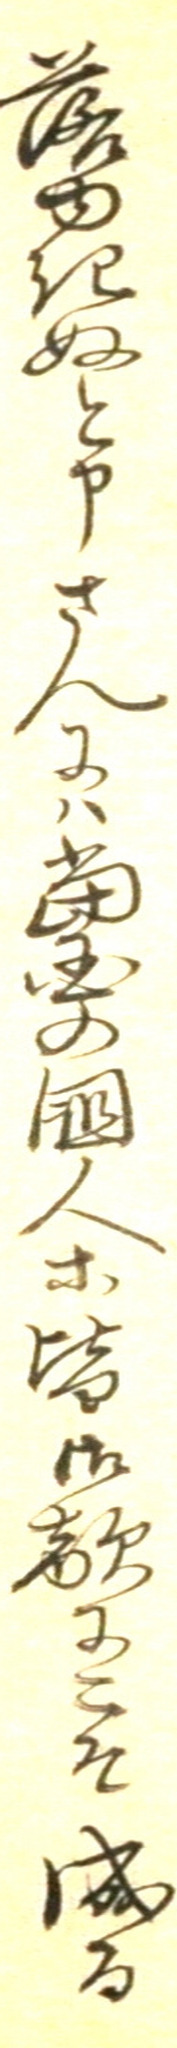落ゆきぬと申さんには当国の国人等皆御敵にこそ成る
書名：藩翰譜（四・中）
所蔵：伊那市立高遠町図書館・合同会社AMANE
